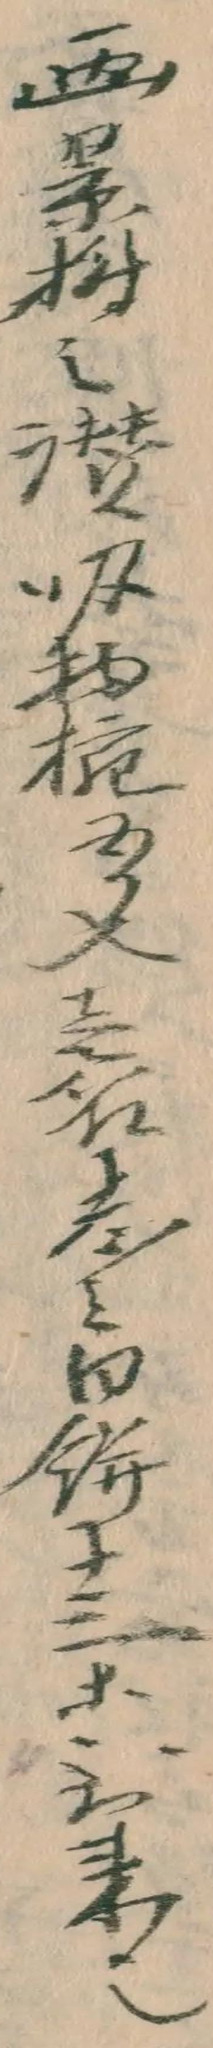画景樹之讃吸物椀五ツ入壱箱䑓之白餅十三等到来也
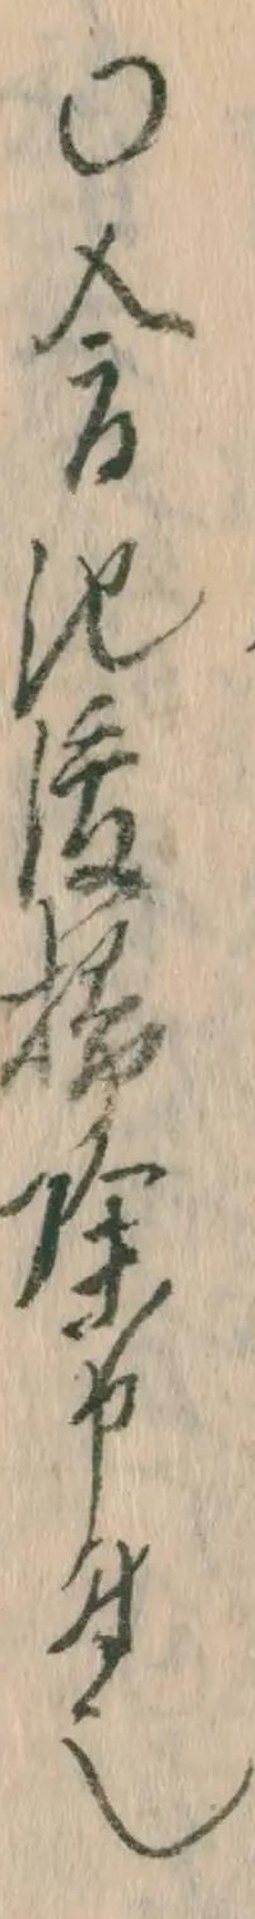○今日池渡掃除申付也
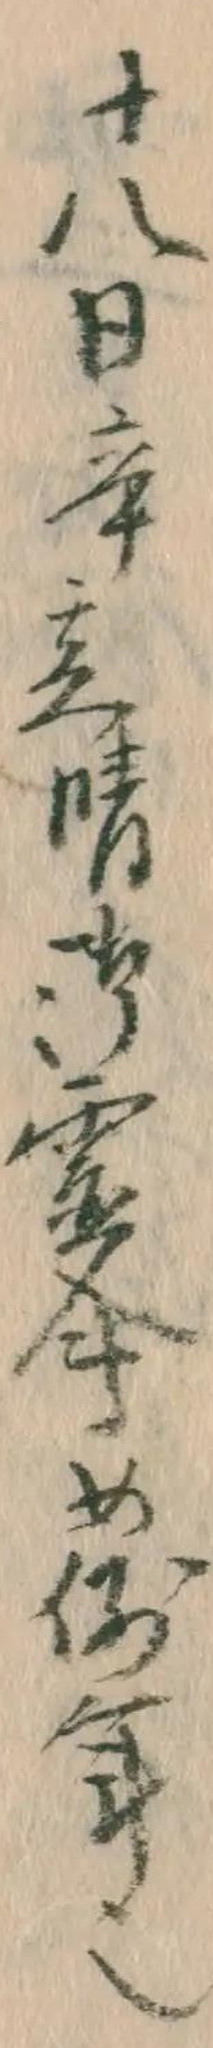十八日辛亥晴御霊會如例年也
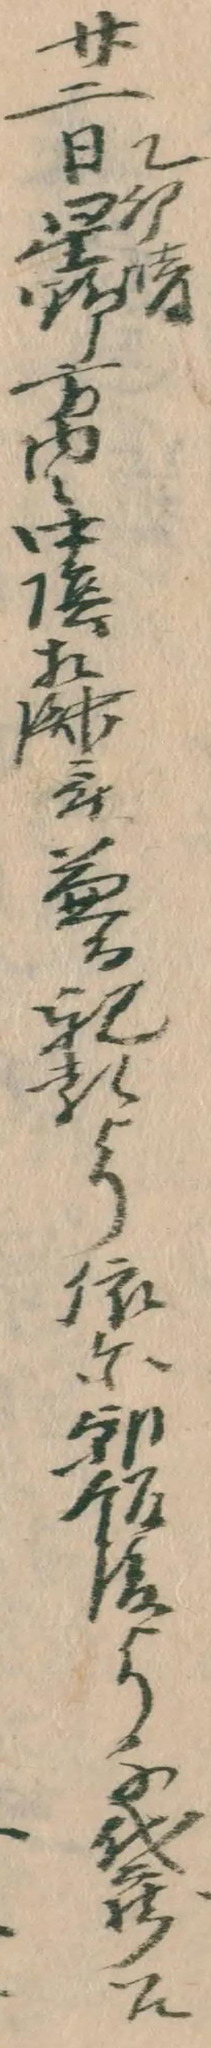廿二日乙卯晴星野方内々中陰相済ニ付兼而親類より依に朝飯後より千代蔵召
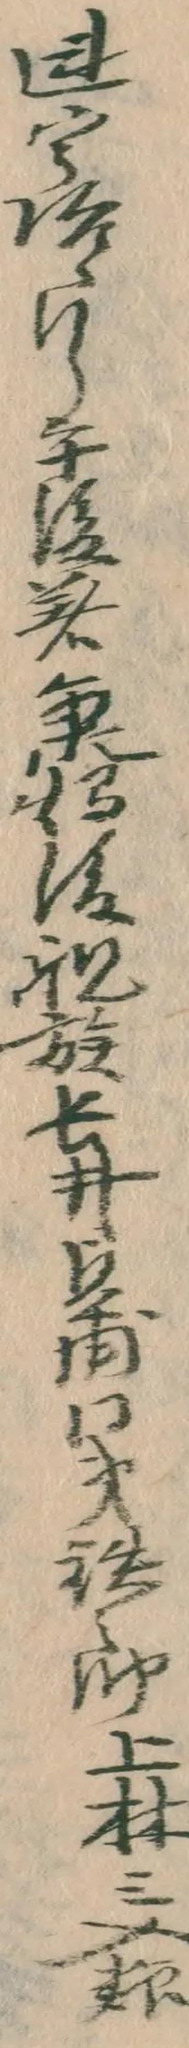連宇治へ行午後着秉燭後親族長井貞甫同弟鉄之助上林三入銀
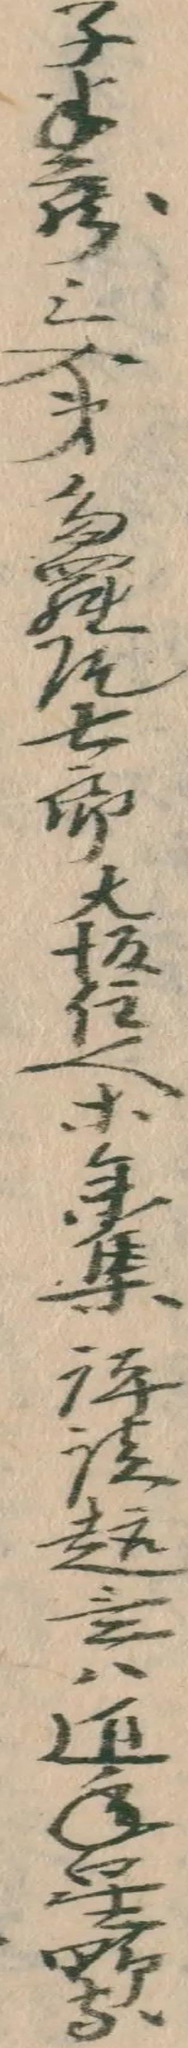子半蔵三入弟多羅尾七郎大坂住人等参集評談趣意ハ近年星野家
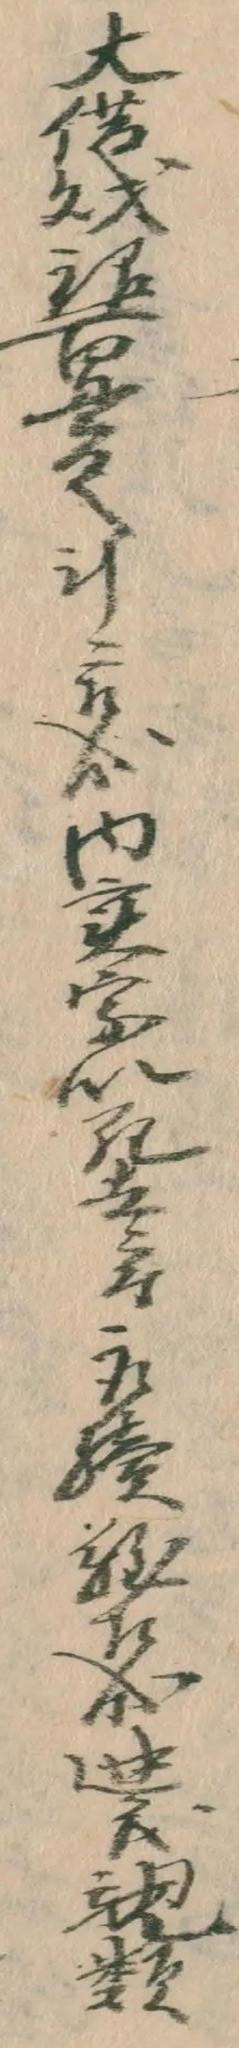大借財銀百貫匁斗ニ相成内実宗以死去ニ付取續難相成迚も親類
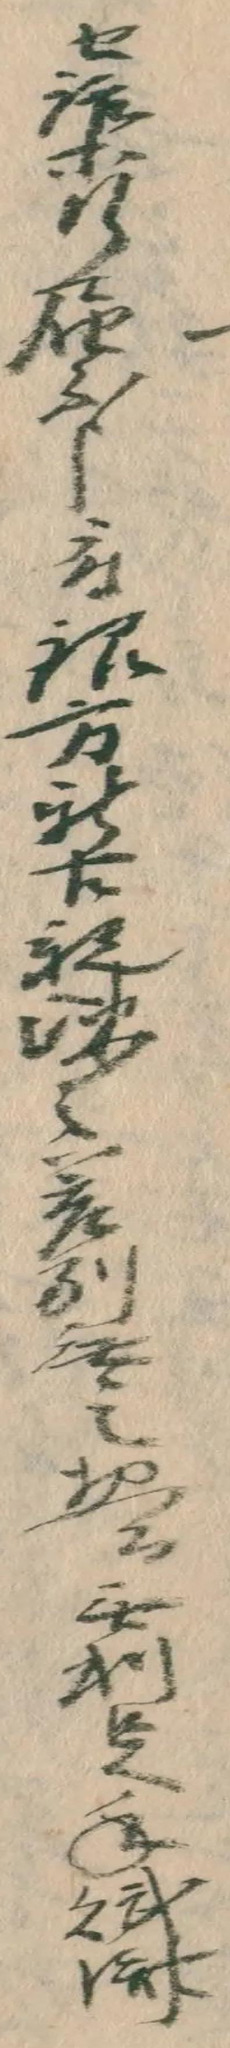世話等行届不申ニ付銀万新古親疎之差別無之惣而無利足年賦済
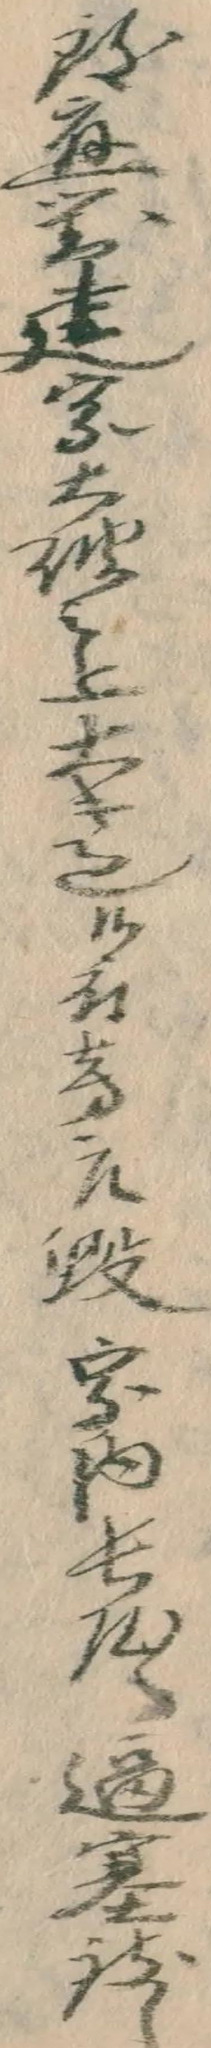致應對建家大破之上大キ過候ニ付取毀宗内長屋へ逼塞致し
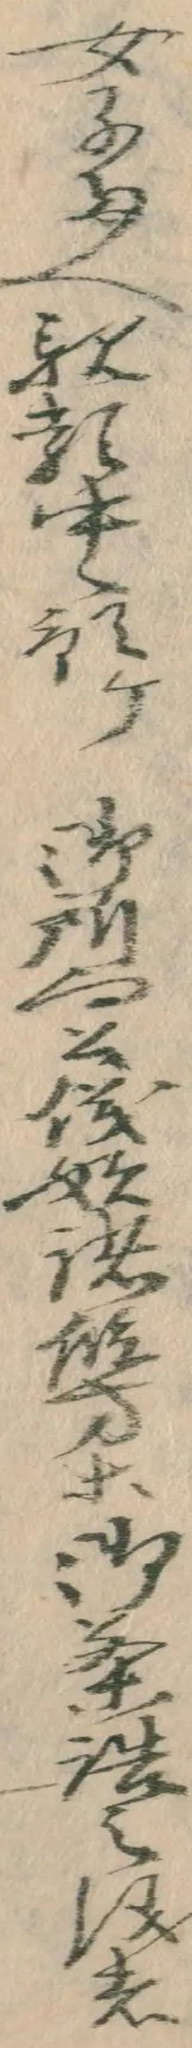女子両人親類中へ預ケ御所向公儀妹諸役方等御茶詰之儀者
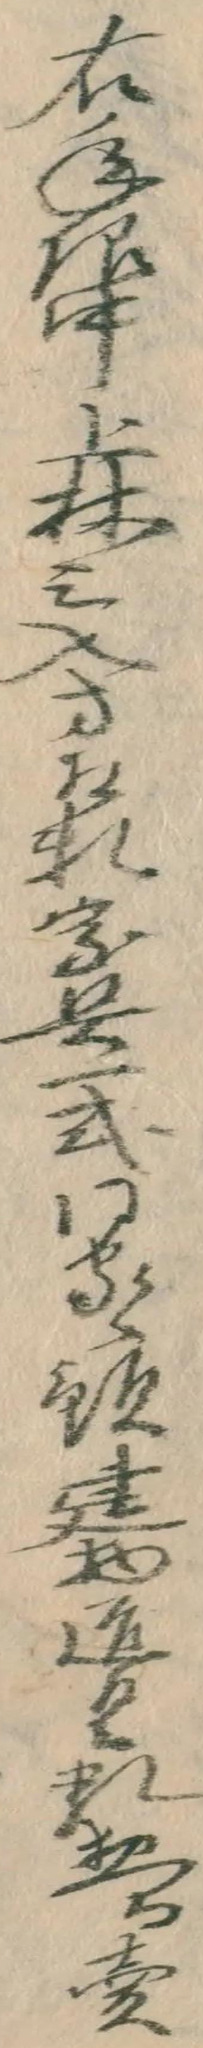右年限中上林三入方相頼家奥一式同家へ預建物道具類惣而賣
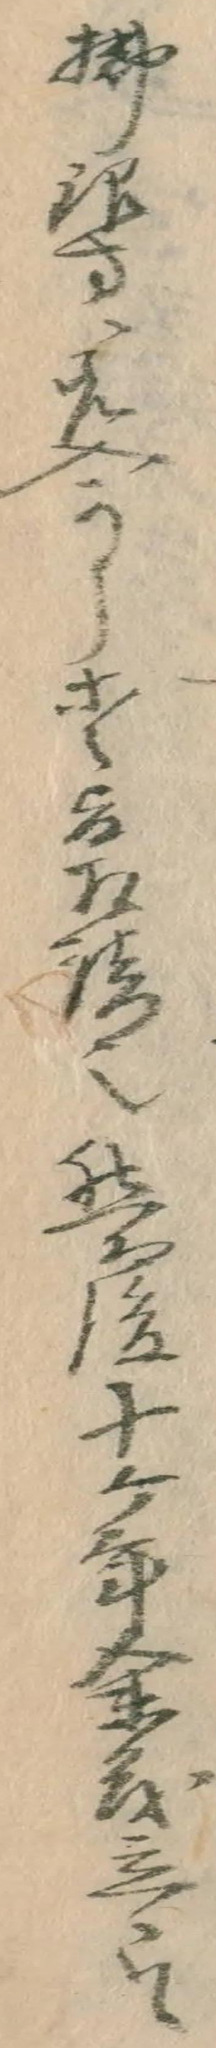払銀方へ差入可申等之旨相談也然る後十ケ年余も立候はゝ

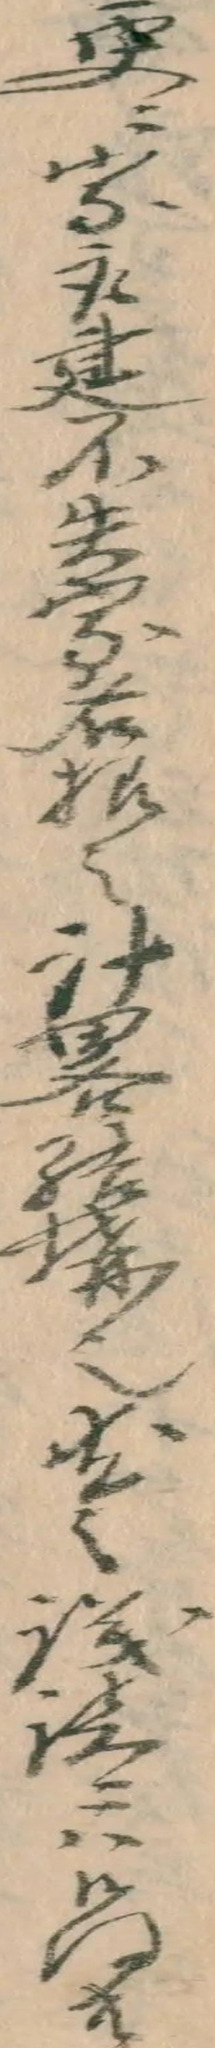更二家取建不失家若様之計畧結構也尤之銭請ニハ候得共
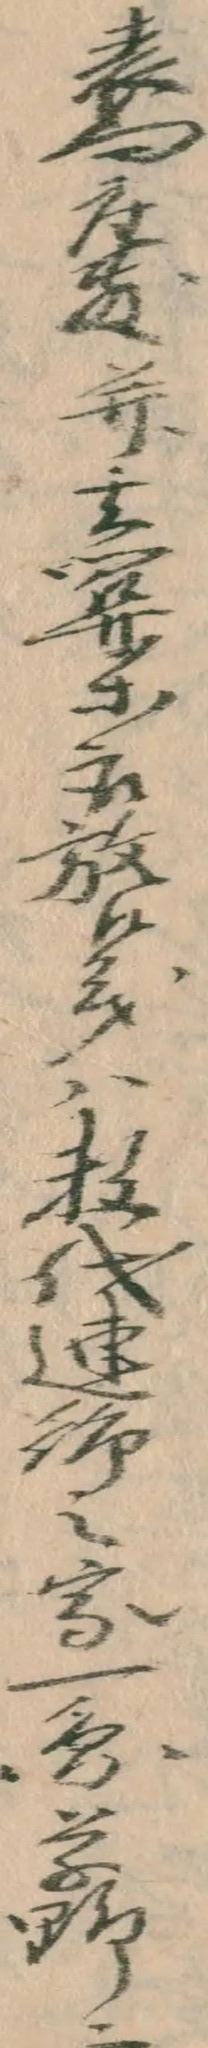表向屋敷并玄関等取放候義ハ数代連綿之家一圖岡野ニ
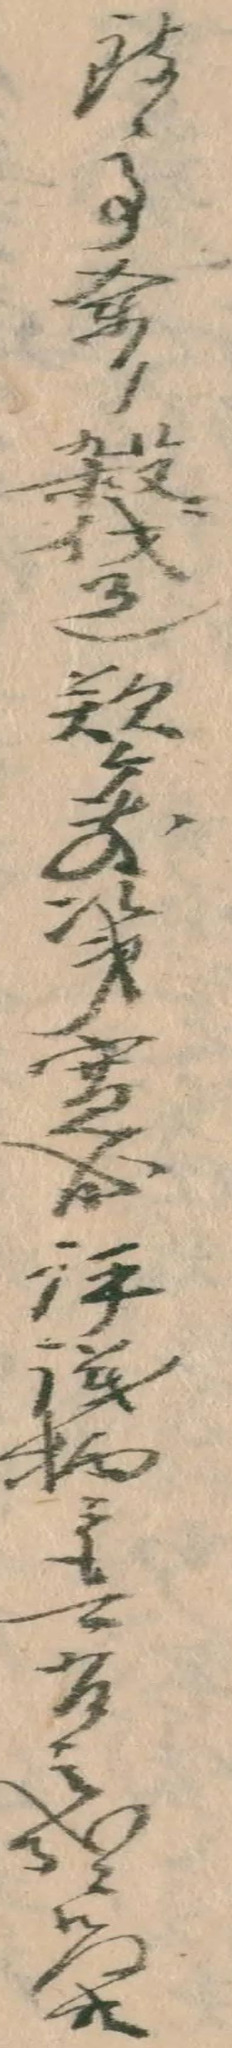致候事余ヶ穀伐歎ヶ敷次第寛成評議物ニも可有之哉ニ候得共
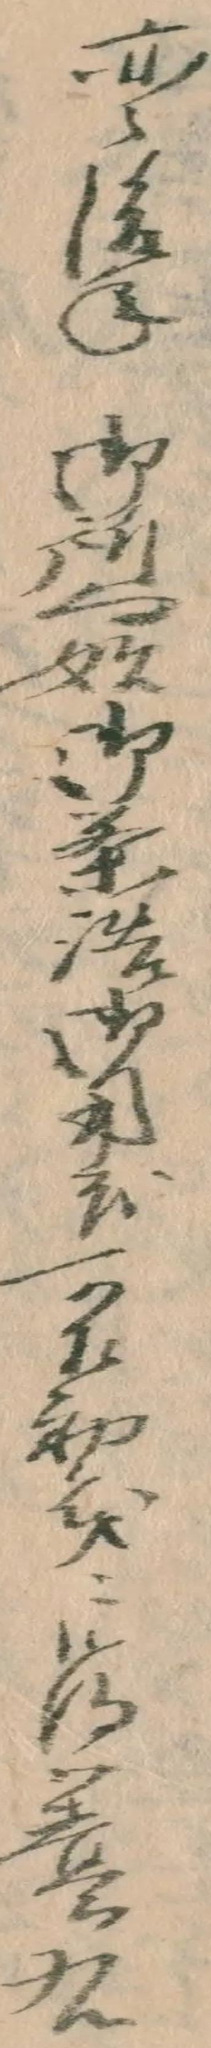亦々後年御所向始御茶詰御用も可相勤義に候得ハ責而右
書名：賀茂社記録. 第69冊
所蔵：国立国会図書館 National Diet Library, JAPAN
